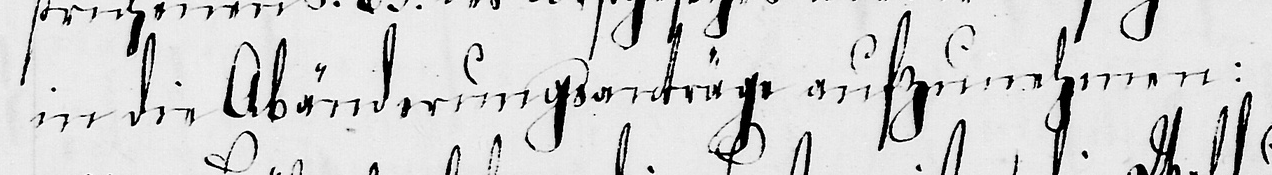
in die Abänderungsanträge aufzunehmen:
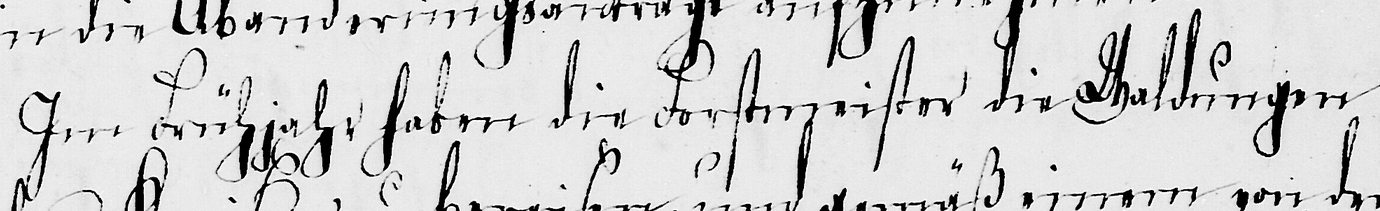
Im Frühjahr haben die Forstmeister die Waldungen
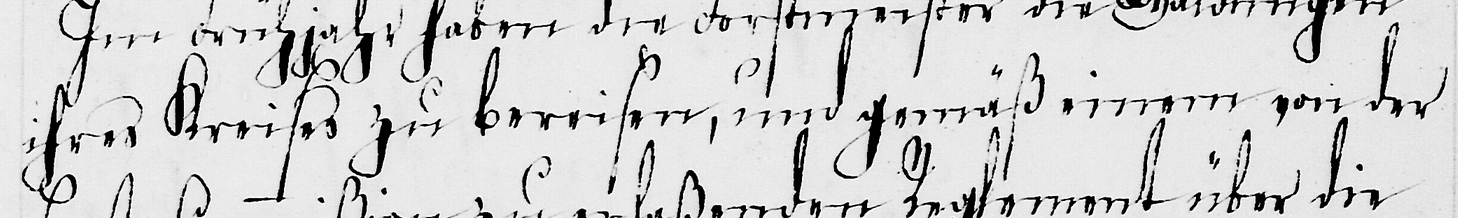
ihres Kreises zu bereisen, und gemäß einem von der
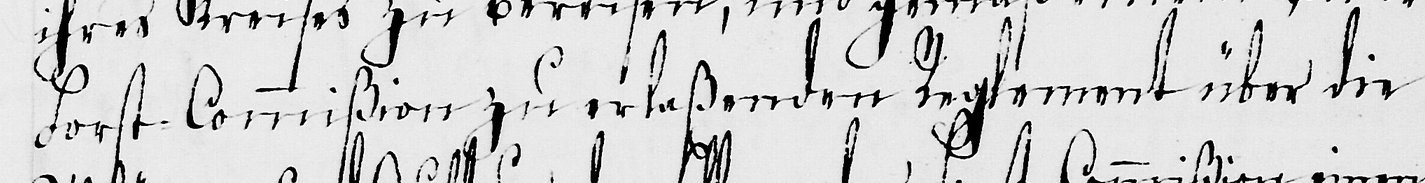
Forst-Commißion zu erlaßenden Reglement über die
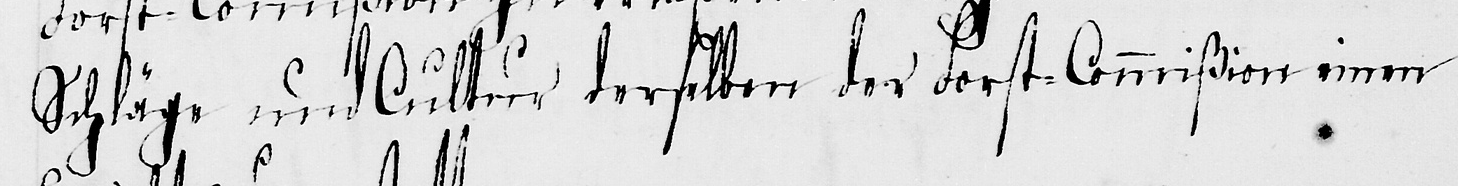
Schläge und Cultur derselben der Forst-Commißion einen
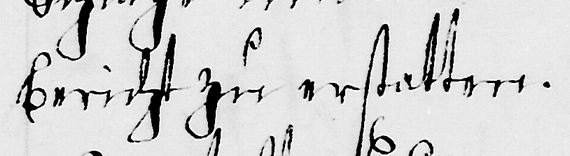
Bericht zu erstatten.
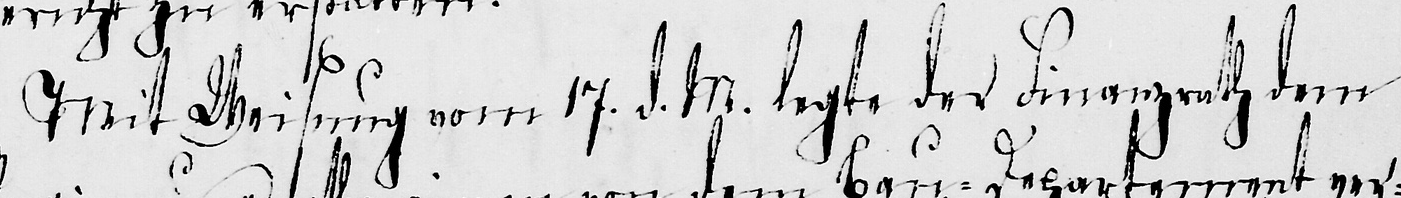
Mit Weisung vom 17. d. M. legte der Finanzrath dem
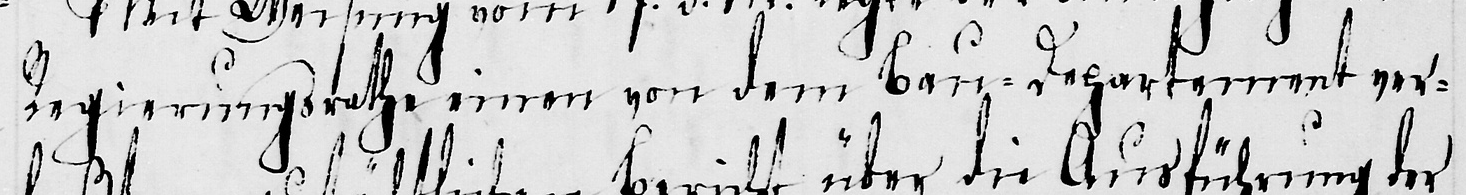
Regierungsrathe einen von dem Bau-Departement ver¬
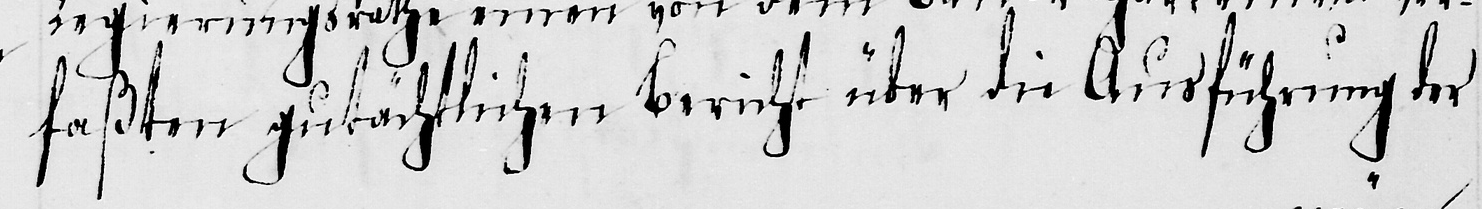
faßten gutächtlichen Bericht über die Ausführung der
